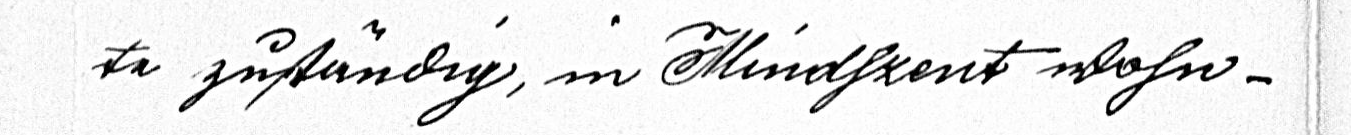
te zuständig, in Mindhzent wohn¬
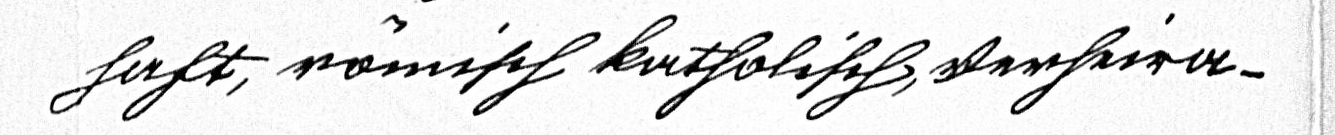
haft, römisch katholisch, verheira¬
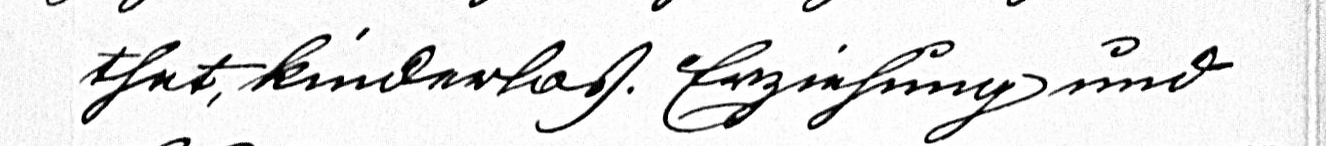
thet, kinderlas. Erziehung und
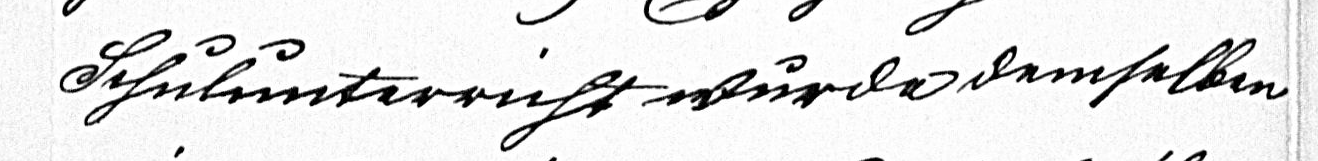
Schulunterricht wurde demselben
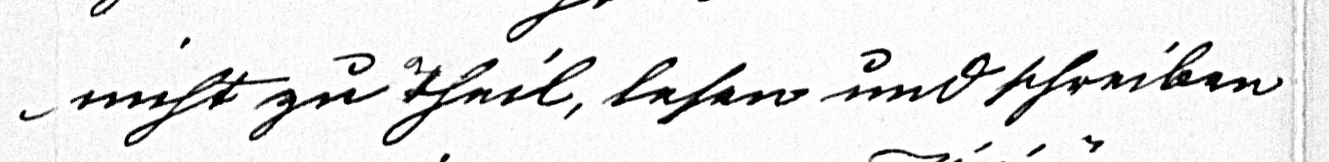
nicht zu Theil, lesen und schreiben
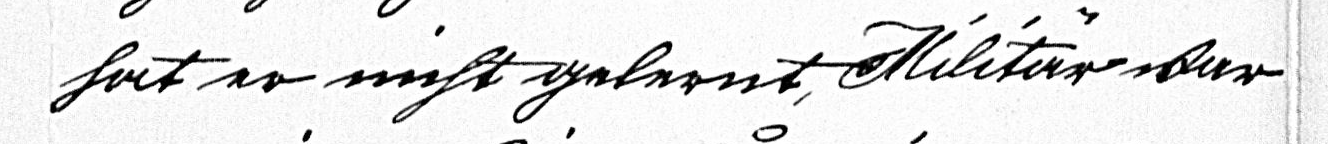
hat er nicht gelernt, Militär war
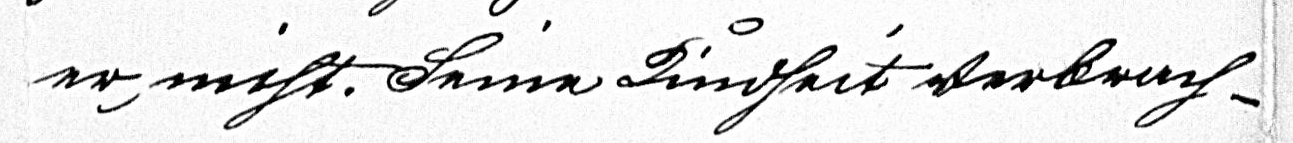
er nicht. Seine Kindheit verbrach¬
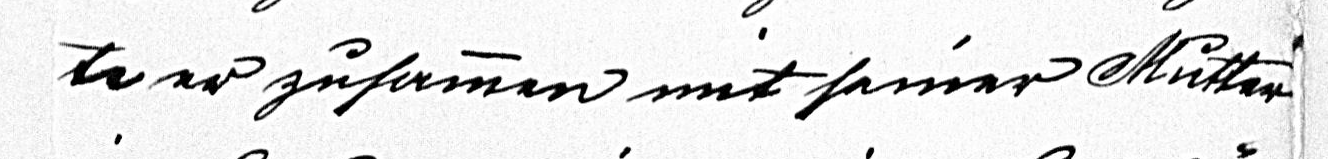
te er zusammen mit seiner Mutter
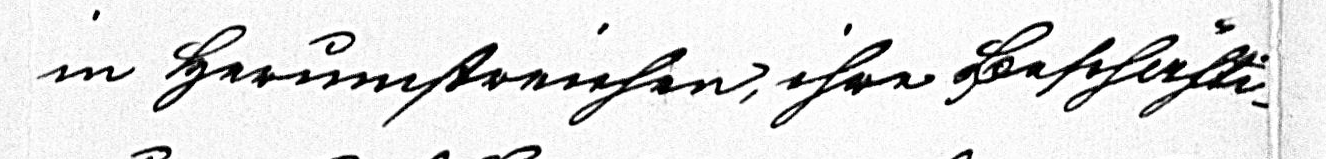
in Herumstreichen, ihre Beschäfti¬
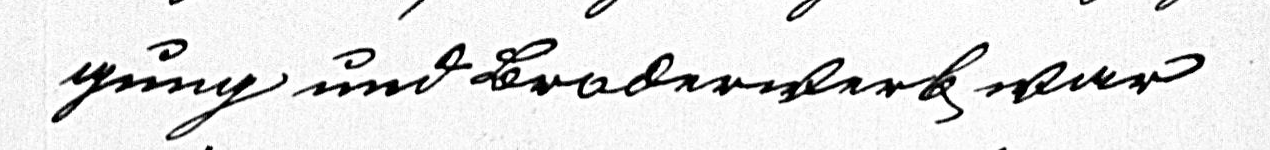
gung und Broderwerb war
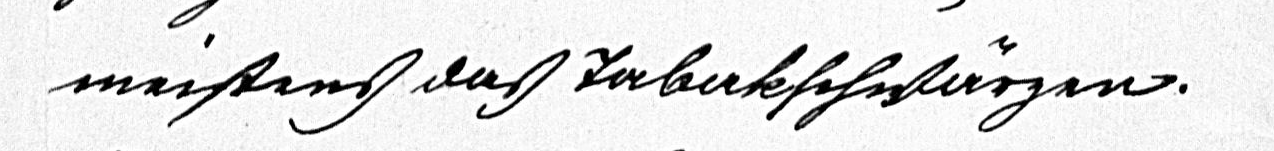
meistens das Tabakschwärzen.
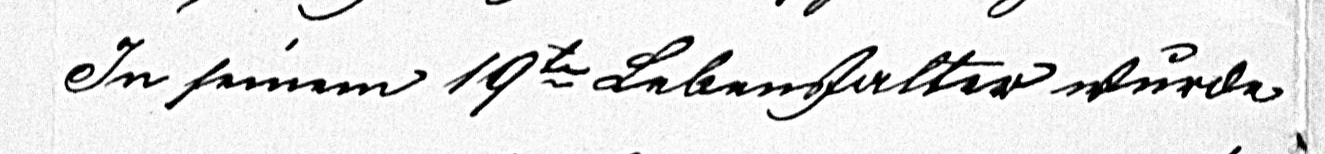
In seinem 19te Lebensalter wurde
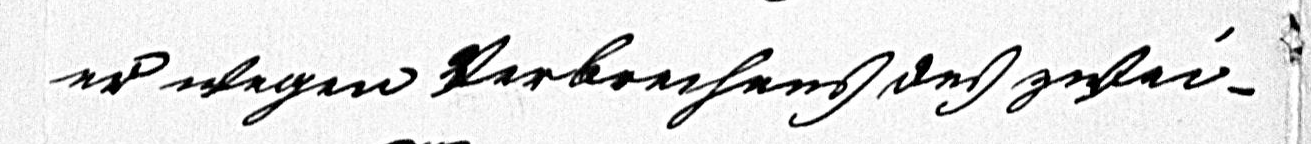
er wegen Verbrechens des zwei¬
